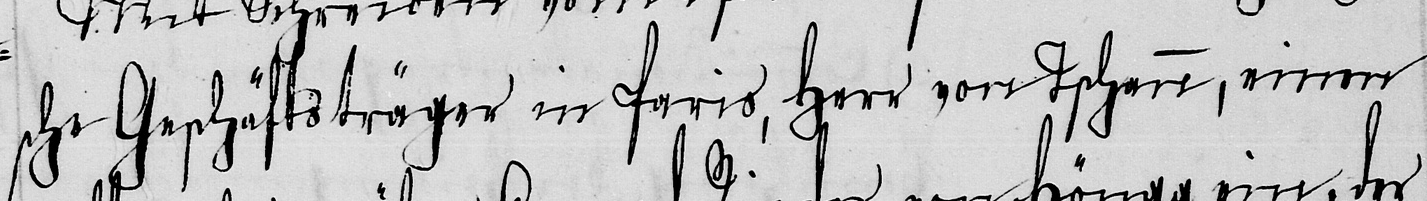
sche Geschäftsträger in Paris, Herr von Tschann, einen
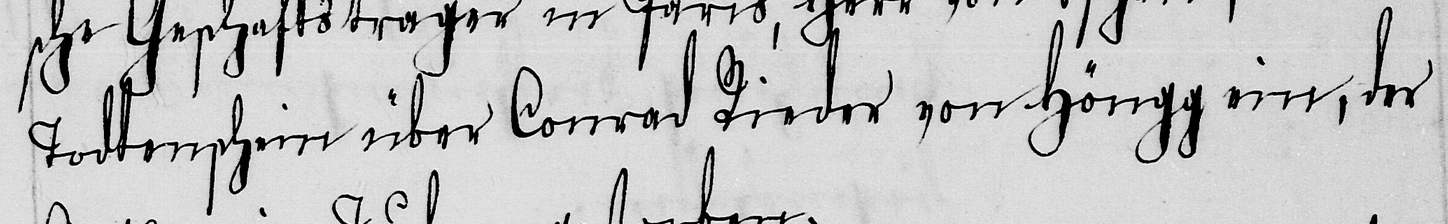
Todtenschein über Conrad Rieder von Höngg ein, der
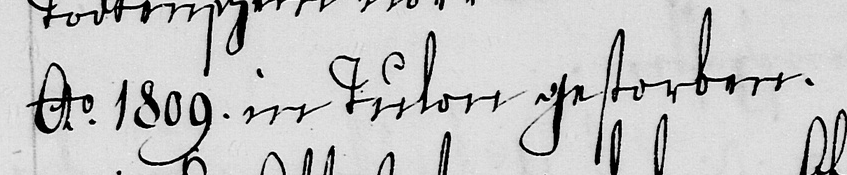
Ao. 1809. in Tulon gestorben.
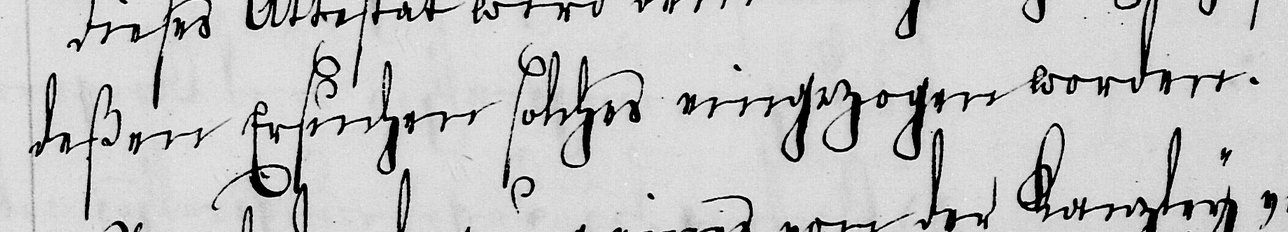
deßen Ersuchen solches eingezogen worden.
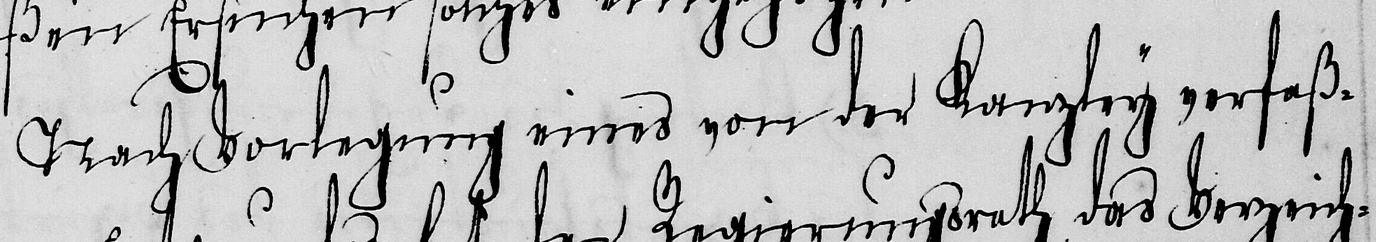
Nach Vorlegung eines von der Kanzley verfaß¬
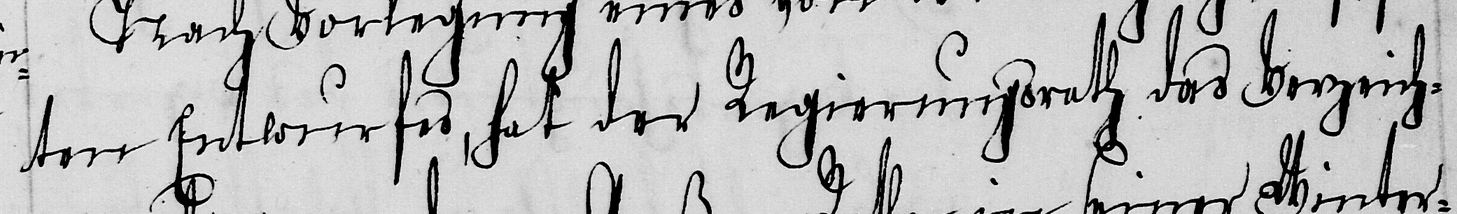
ten Entwurfes, hat der Regierungsrath das Verzeich¬
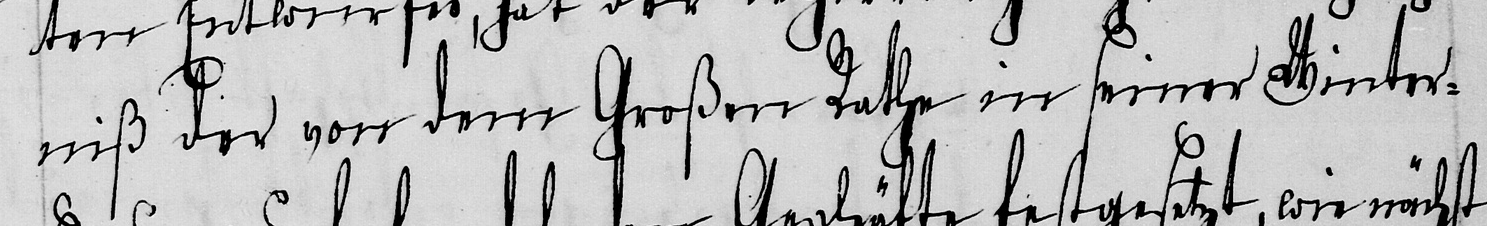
niß der von dem Großen Rathe in seiner Winters¬
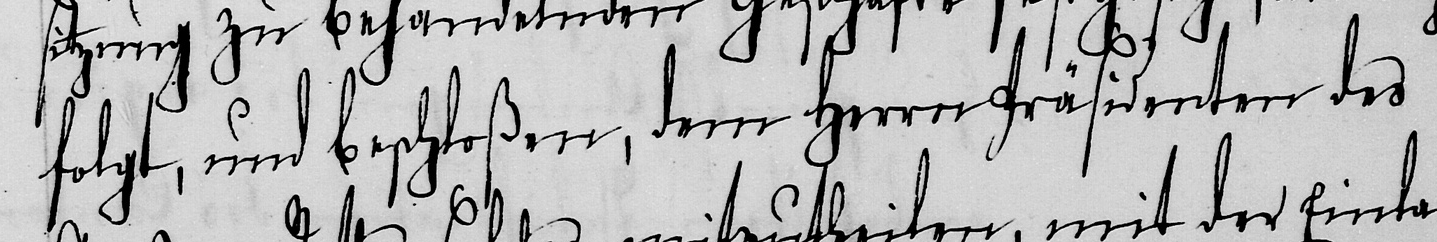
folgt, und beschloßen, dem Herrn Präsidenten des
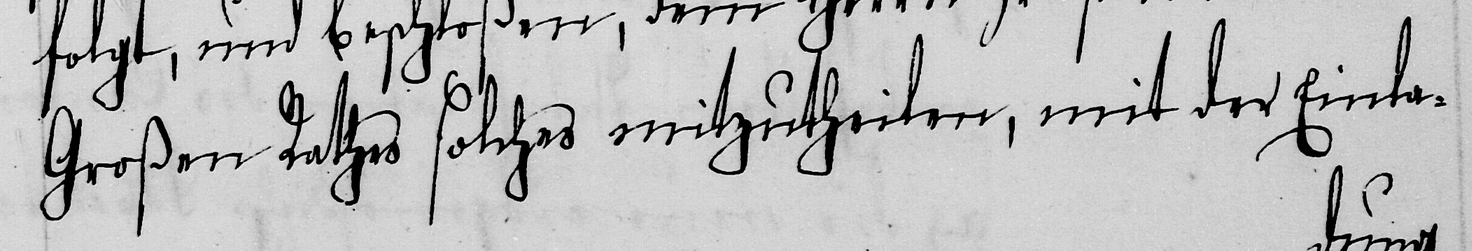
Großen Rathes solches mitzutheilen, mit der Einla-
